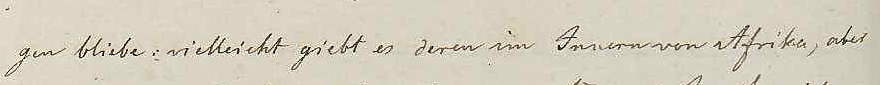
gen bliebe: vielleicht giebt es deren im Innern von Afrika, aber
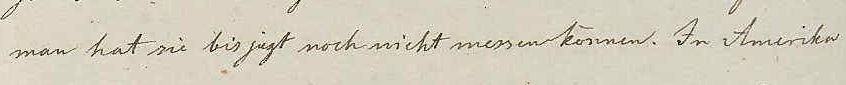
man hat sie bis jezt noch nicht messen können. In Amerika
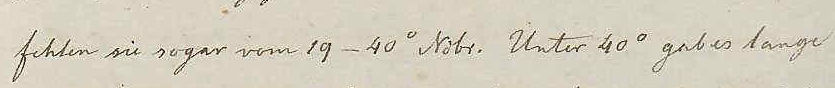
fehlen sie sogar vom 19–40° Ndbr. Unter 40° gab es lange
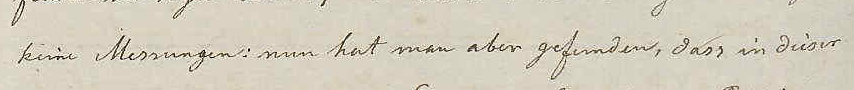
keine Messungen: nun hat man aber gefunden, dass in dieser
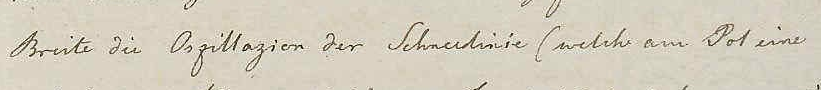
Breite die Oszillazion der Schneelinie 2200 Fus beträgt, d. h. um
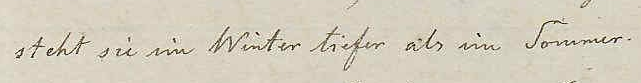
steht sie im Winter tiefer als im Sommer.
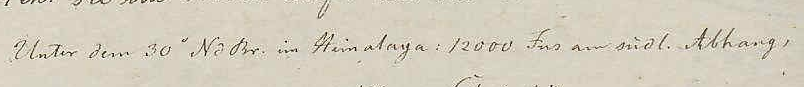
Unter dem 30° Ndbr. im Himalaya: 12000 Fus am südl. Abhang,
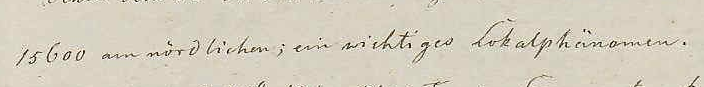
15600 am nördlichen; ein wichtiges Lokalphänomen.
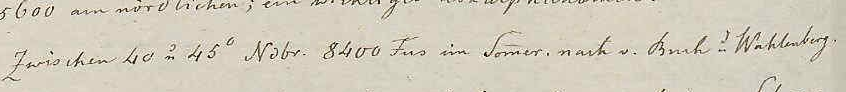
Zwischen 40 u 45° Ndbr. 8400 Fus im Som̃er nach v. Buch u Wahlenberg.
